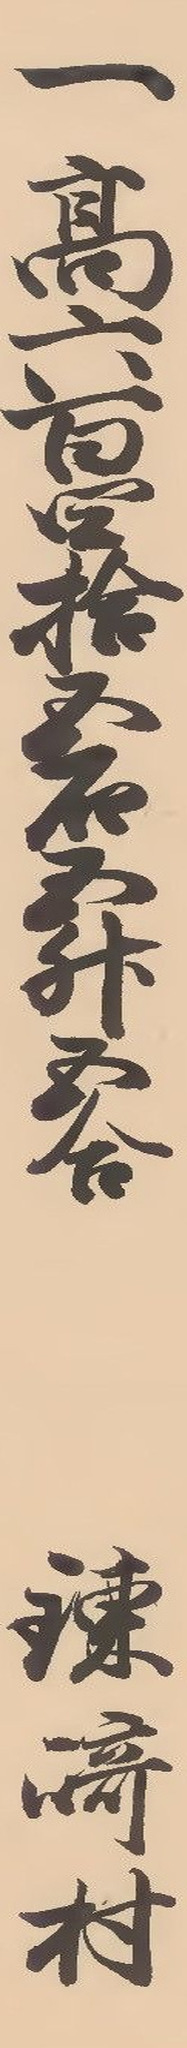一高六百四拾五石五升五合錬崎村
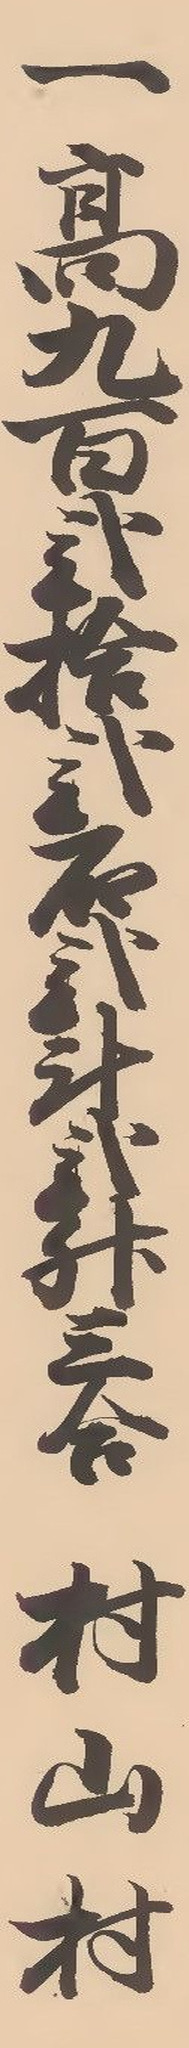一高九百弐拾弐石弐斗弐升三合村山村
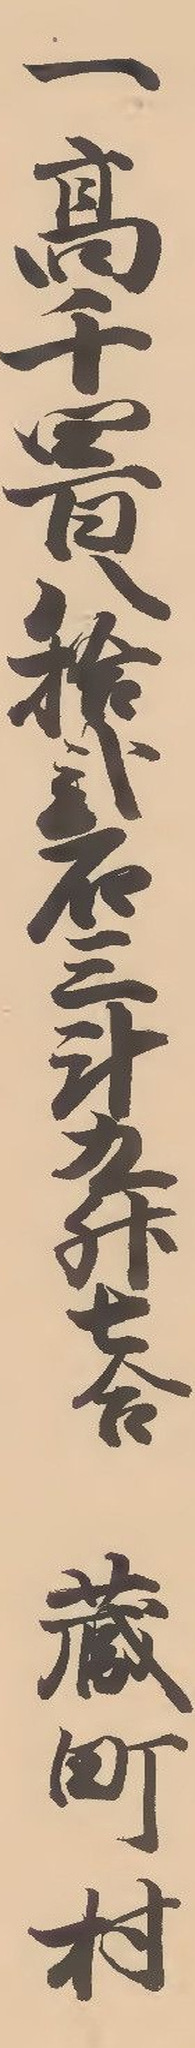一高千四百八拾弐石三斗九升七合蔵町村
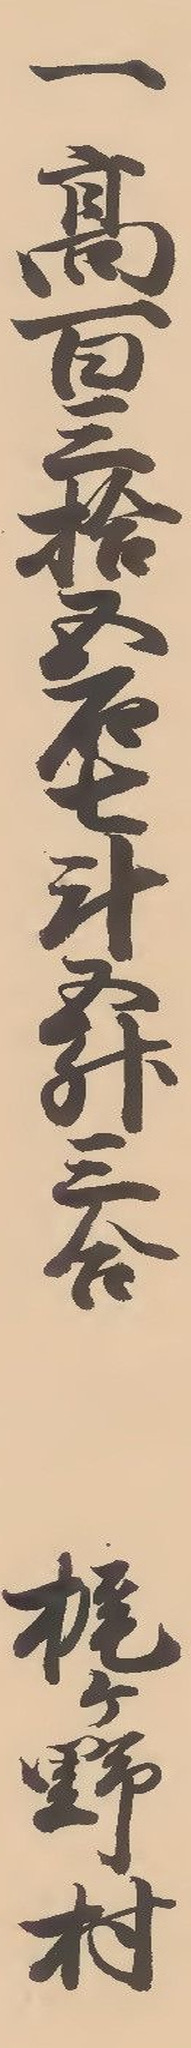一高百三拾五石七斗五升三合梶ヶ野村
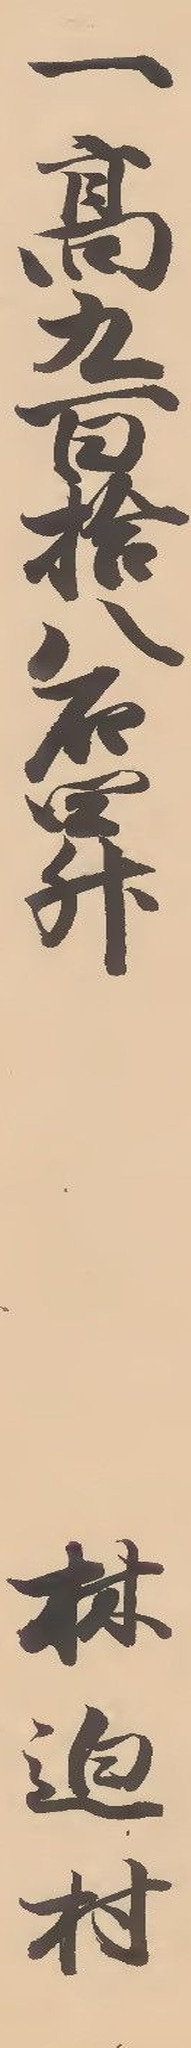一高九百拾八石四升林迫村
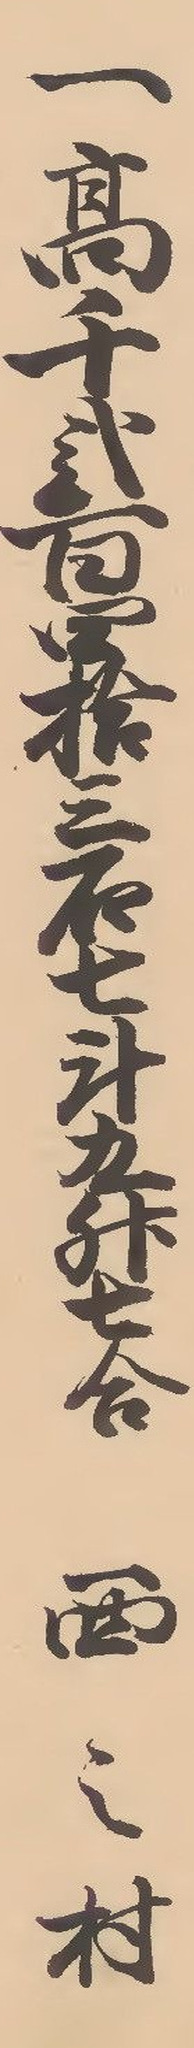一高千弐百四拾三石七斗九升七合西之村

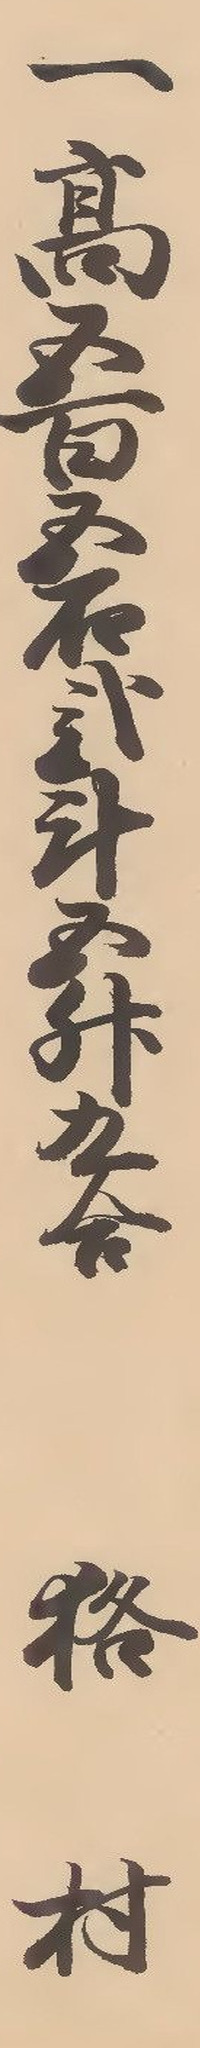一高五百五石弐斗五升九合格村
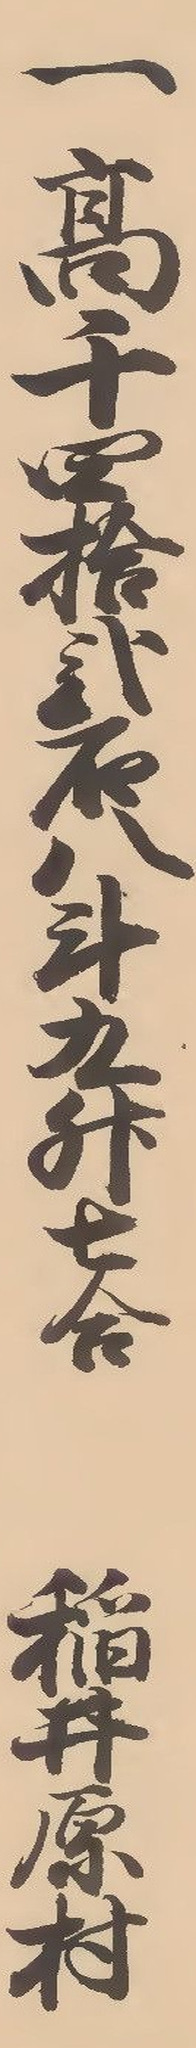一高千四拾弐石八斗九升七合稲井原村
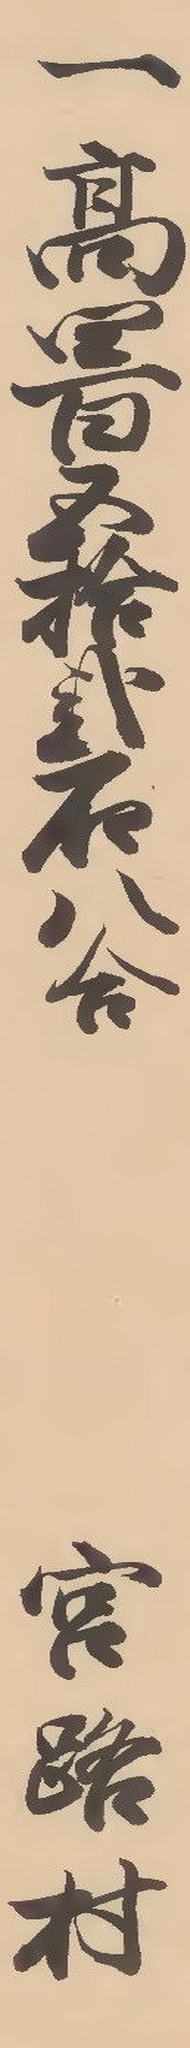一高四百五拾弐石八合宮路村
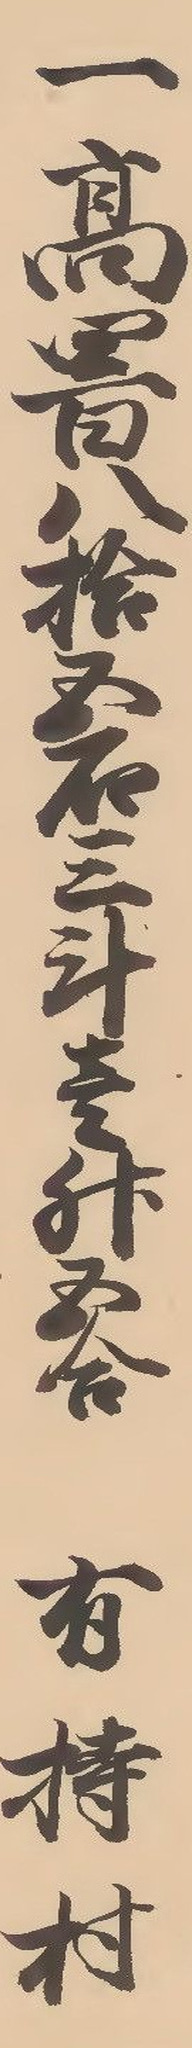一高四百八拾五石三斗壱升五合有持村
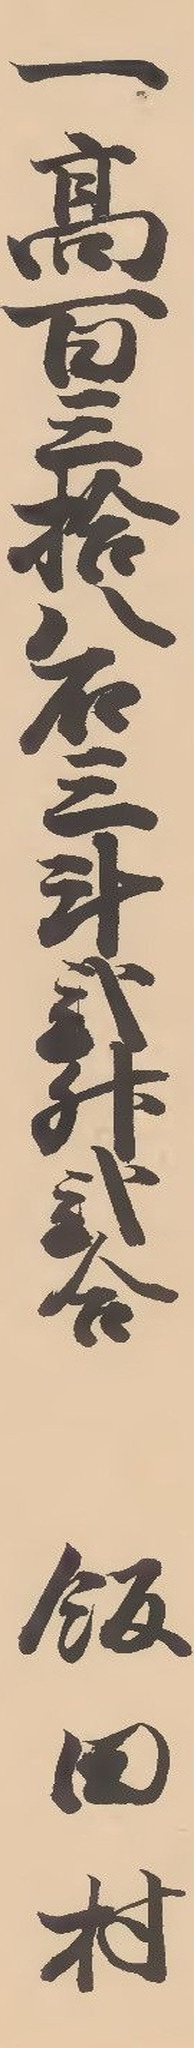一高百三拾八石三斗弐升弐合飯田村
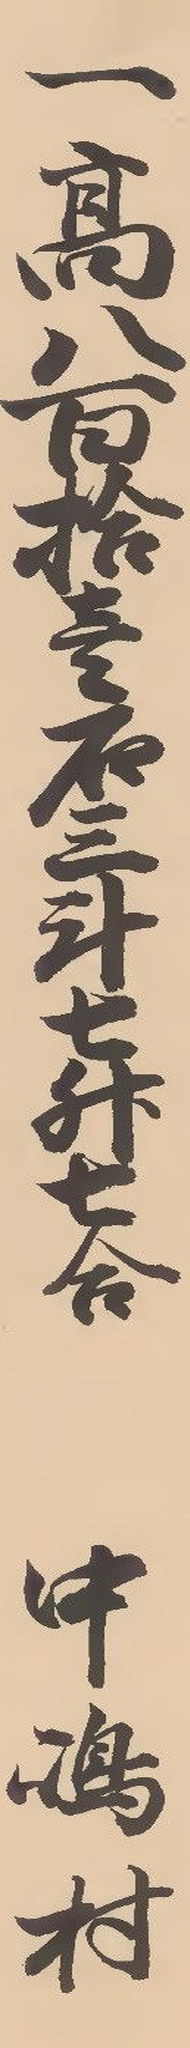一高八百拾壱石三斗七升七合中島村
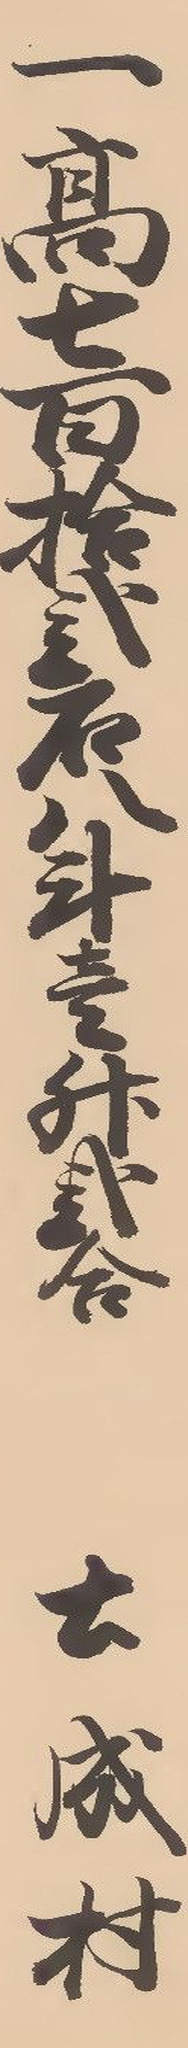一高七百拾弐石八斗壱升弐合土成村
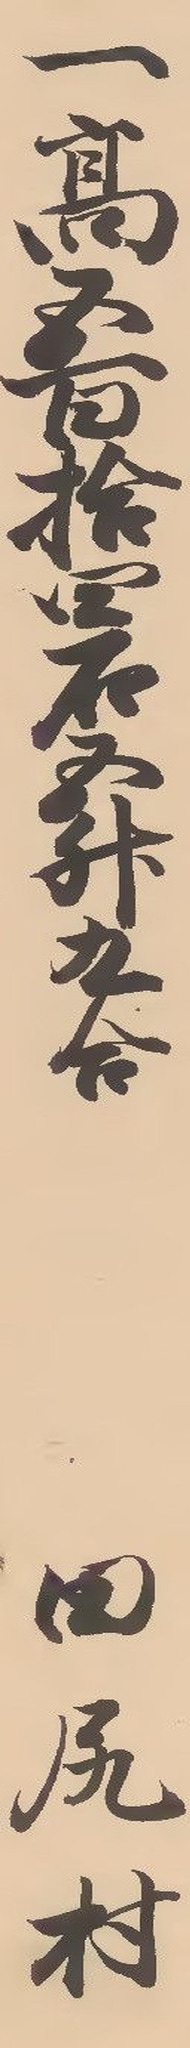一高五百拾四石五升九合田尻村

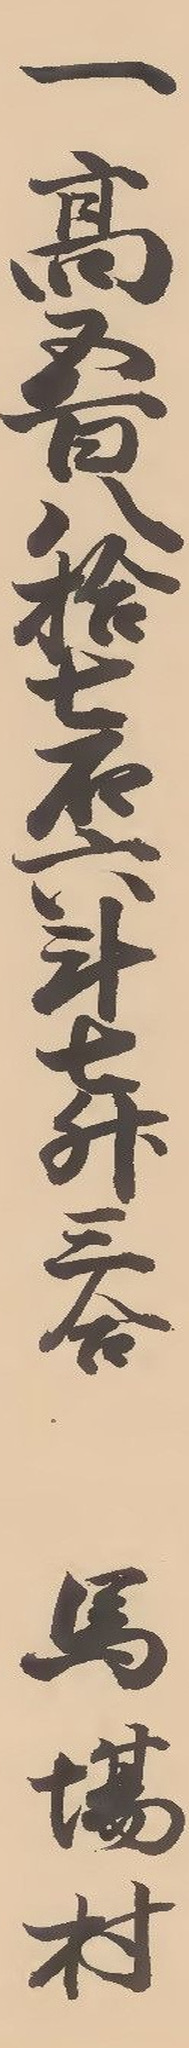一高五百八拾七石六斗七升三合馬場村
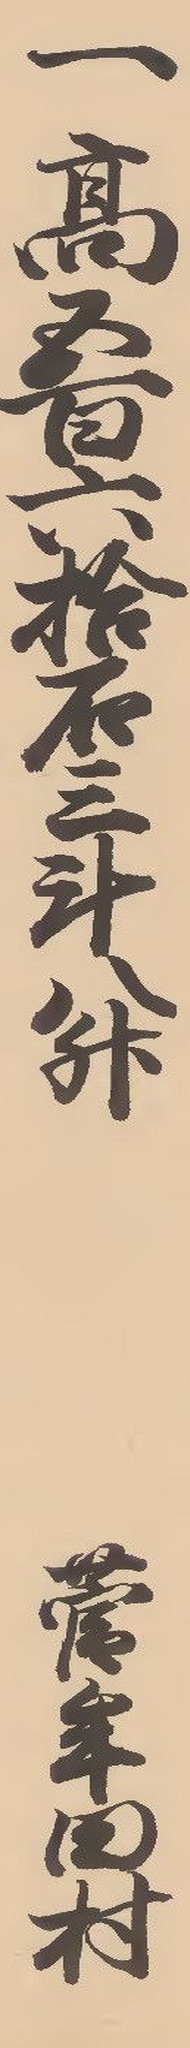一高五百六拾石三斗八升菅牟田村
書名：大隅国郷帳
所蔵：国立公文書館 National Archives of Japan
